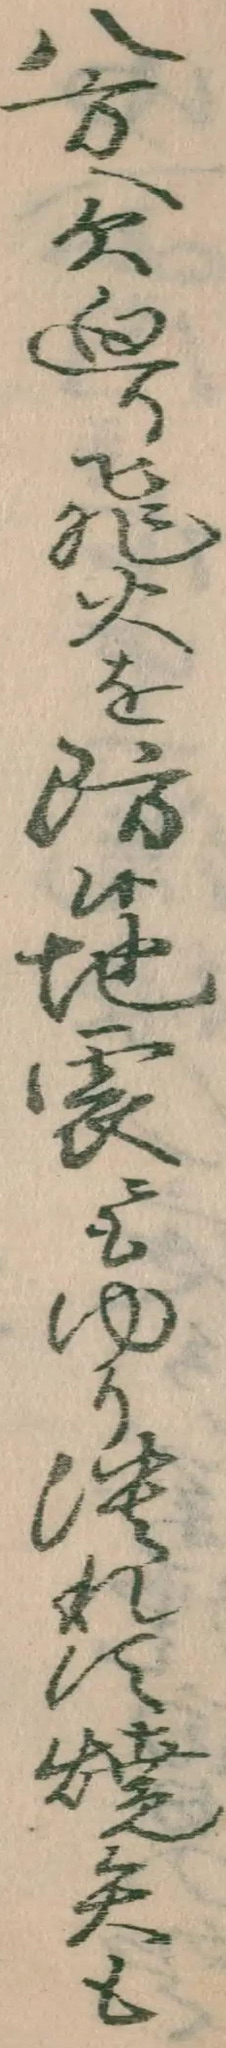八方へ欠廻り飛火を防候地震ニもゆり潰れす焼失も
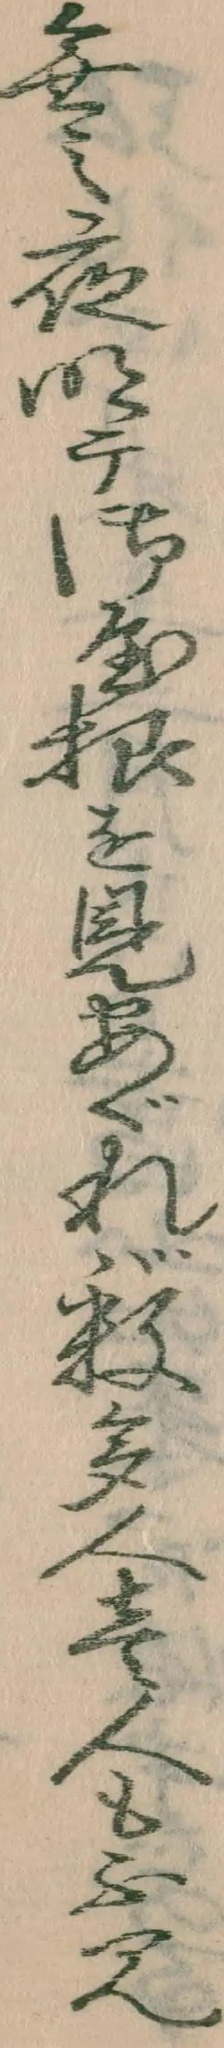無之夜明テ御屋根を見あぐれば数多人壱人も不見
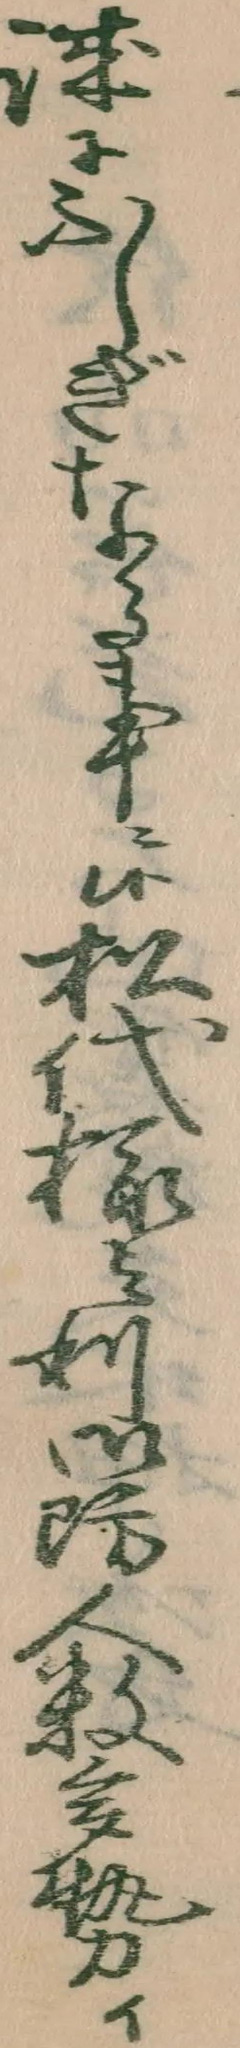誠にふしぎなる事二候松代様より御防人数多勢イ
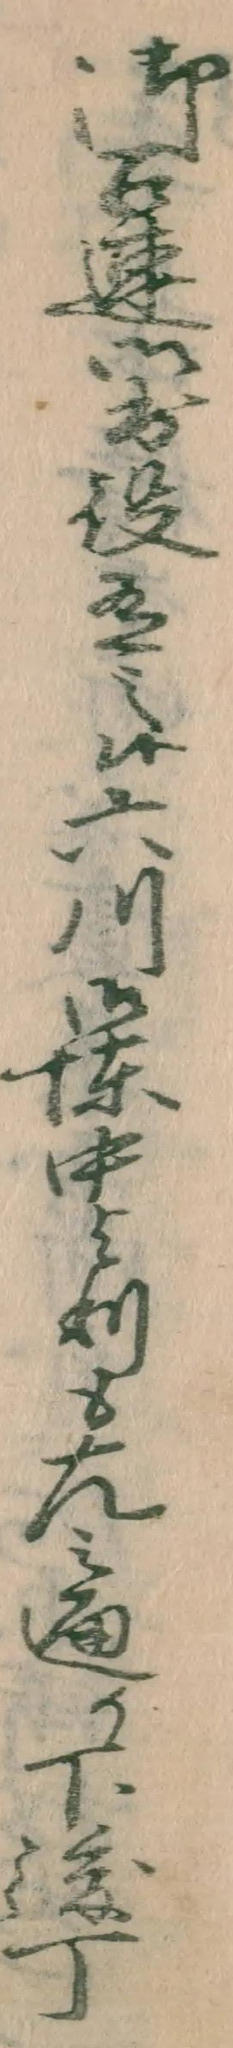御召連御出役有之候六川御棟中よりも左之通り下後丁
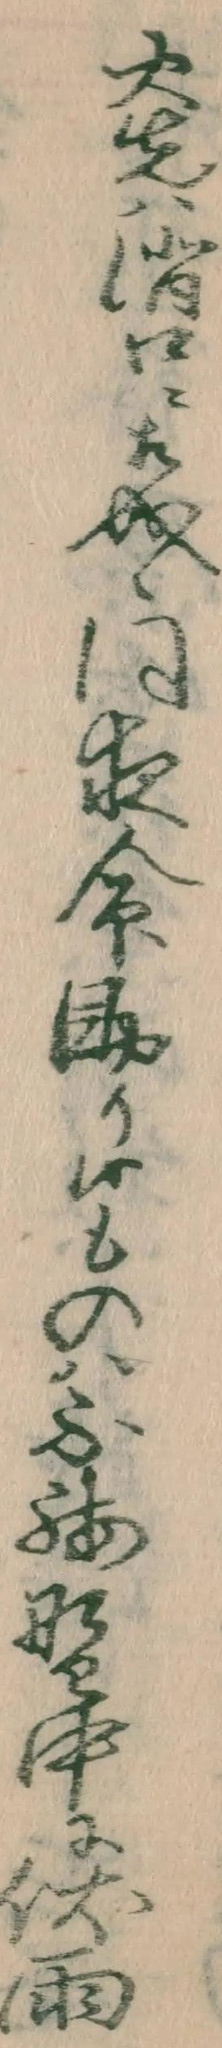火先は消口二相成候同夜命助り候ものは不残野中に伏雨
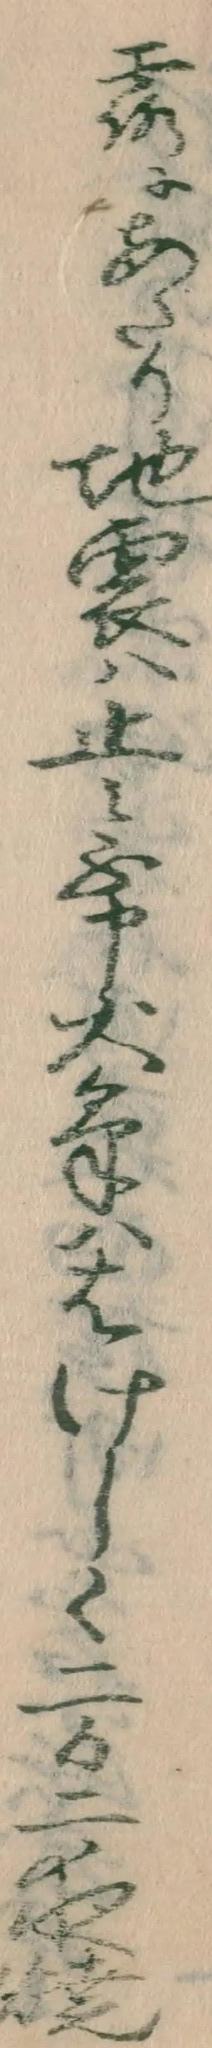露にあたり地震は止之不申火気ははけしく二日二夜焼
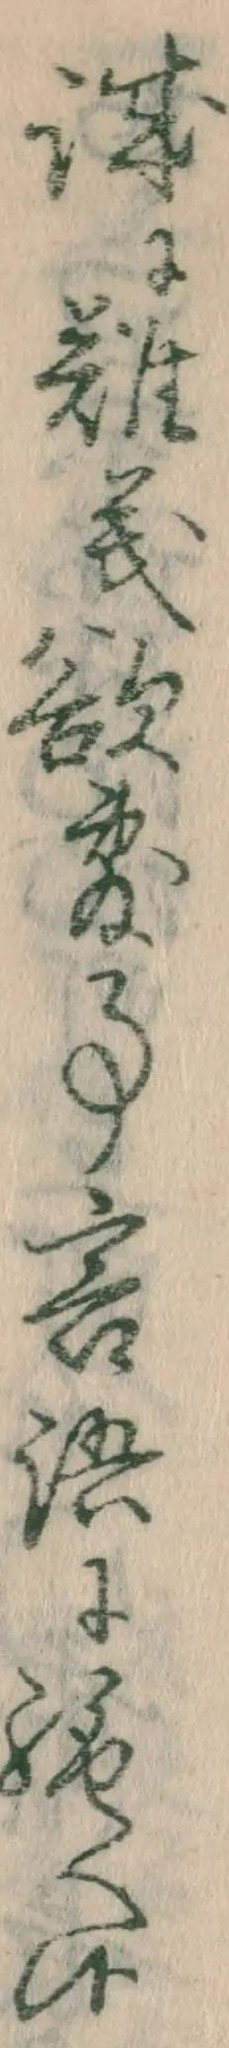誠に難義歎敷事言語に絶へ候
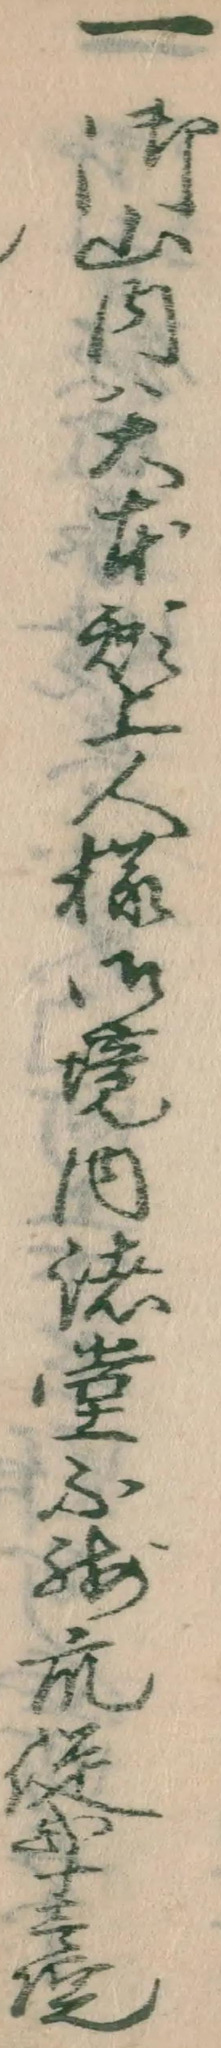一御山内は大本願上人様御境内諸堂不残衆徒弐十壱院
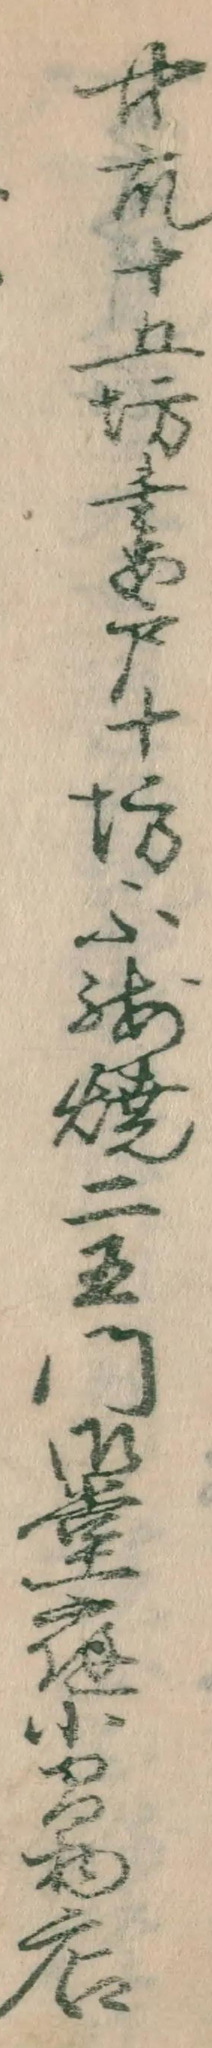中衆十五坊妻戸十坊不残焼二王門御堂庭小間物店
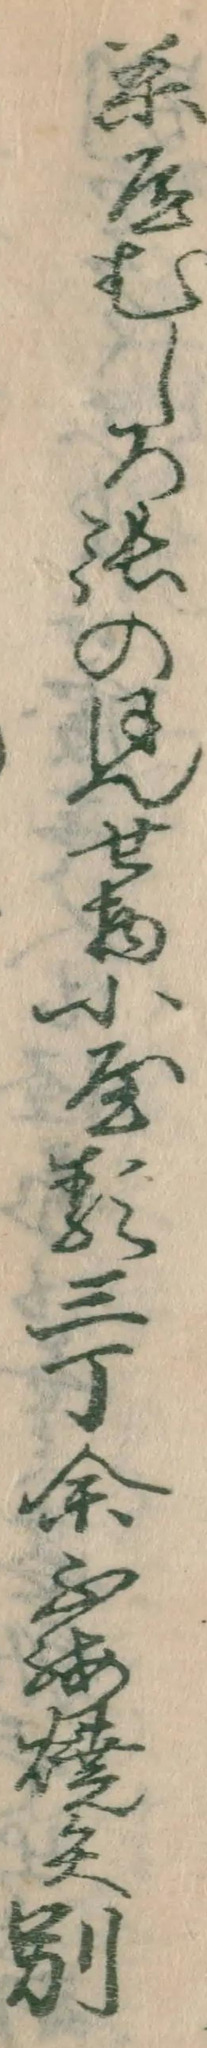茶屋むしろ張の見せ物小屋類三丁余不残焼失別
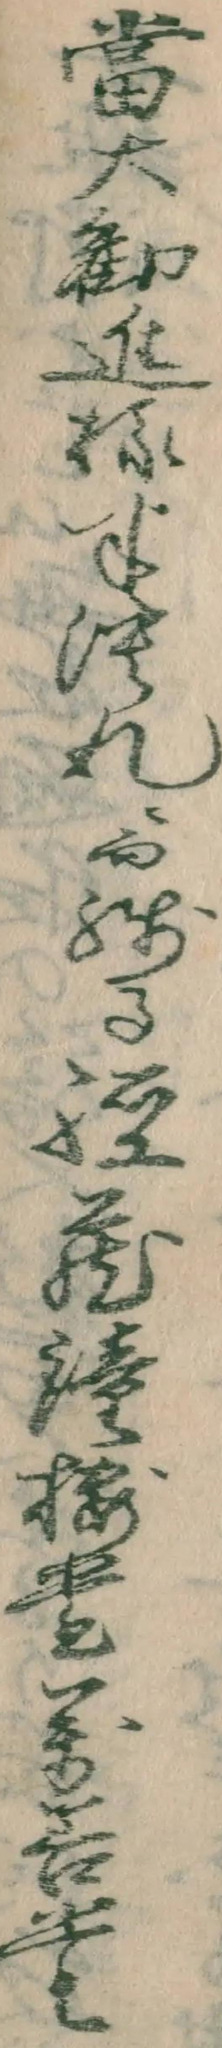当大勧進様半潰れ二而残る経蔵鐘楼堂万善堂

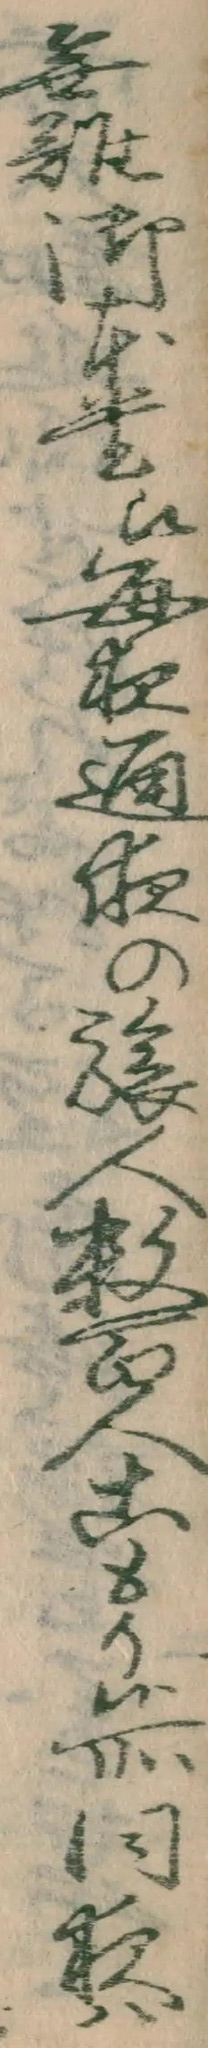無難御本堂江毎夜通夜の旅人数百人こもり候所同夜は
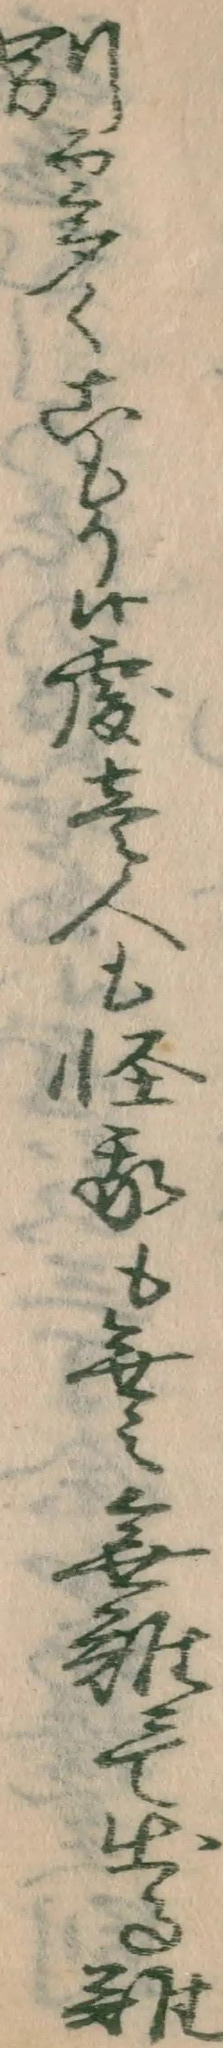別而多くこもり候処壱人も怪我も無之無難二て出る難
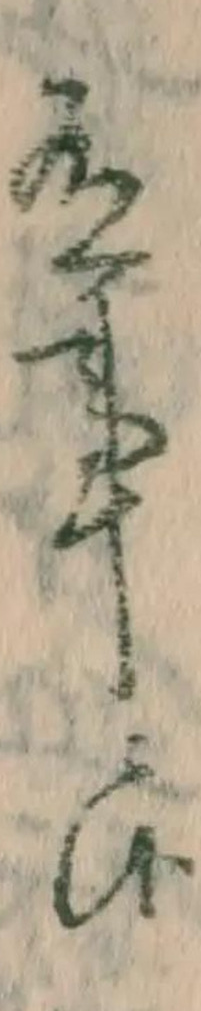有事二候
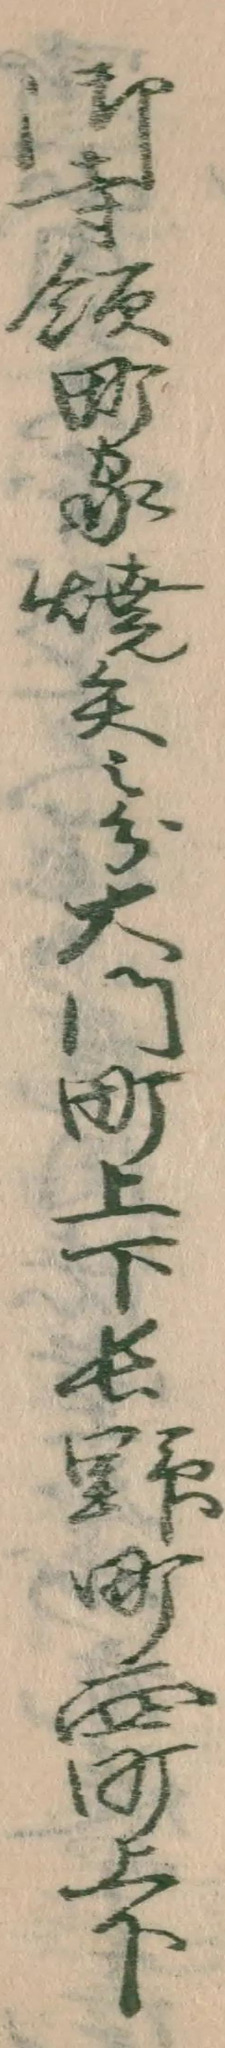一御寺領町家焼失之分大門町上下長野町西町上下
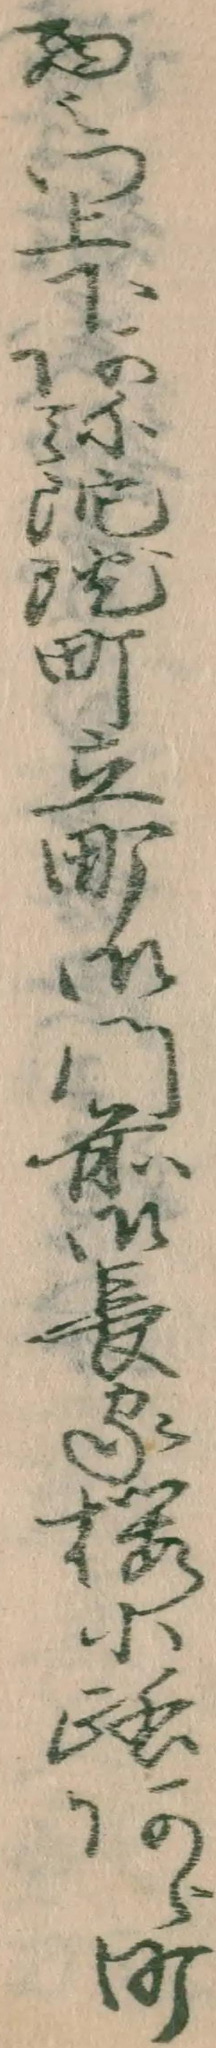西之門上下阿弥陀院町立町御門前御長家桜小路あら町
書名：大地震
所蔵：国立国会図書館 National Diet Library, JAPAN
